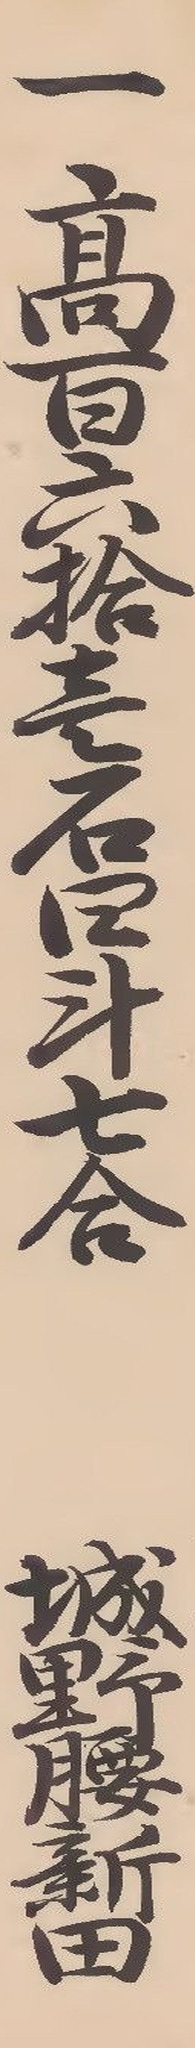一高百六拾壱石四斗七合城野腰新田
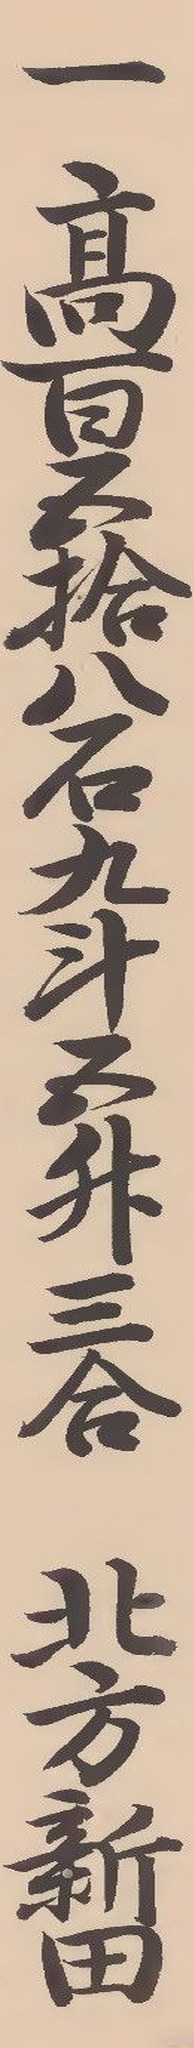一高百五拾八石九斗五升三合北方新田
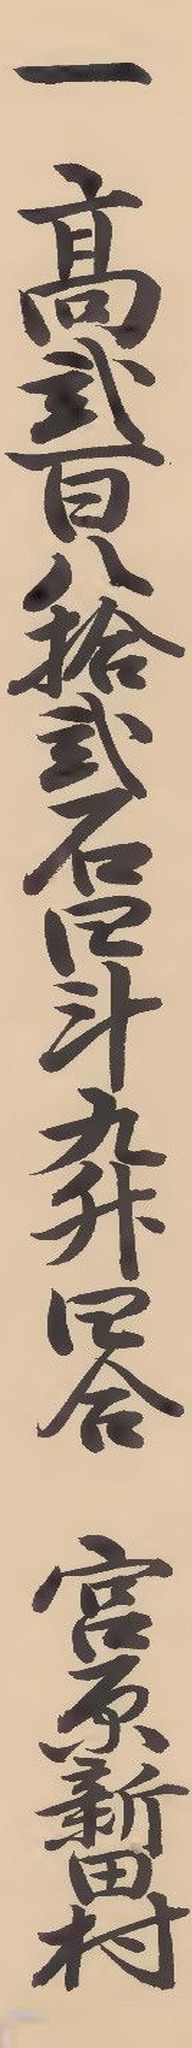一高弐百八拾弐石四斗九升四合宮原新田村
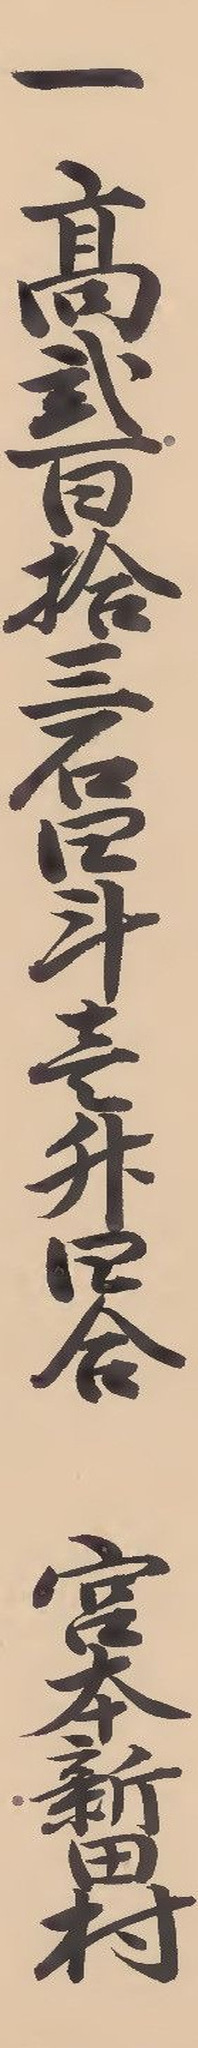一高弐百拾三石四斗壱升四合宮本新田村
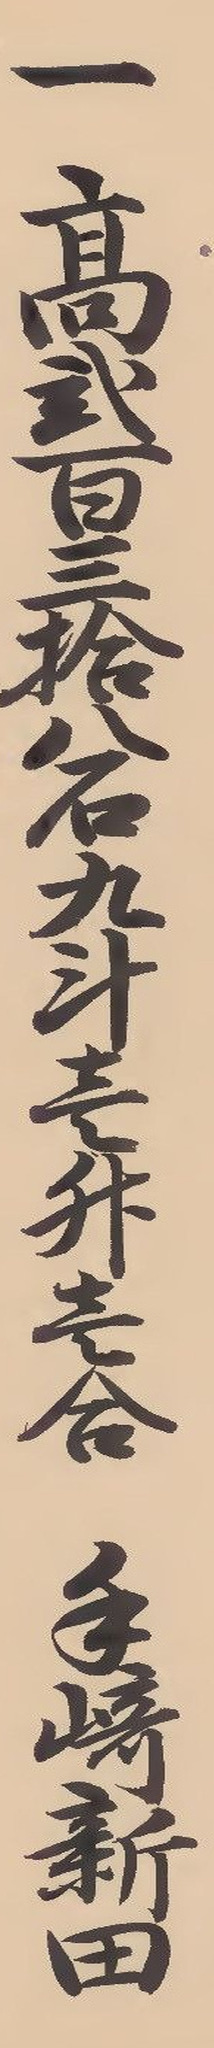一高弐百三拾八石九斗壱升壱合手崎新田
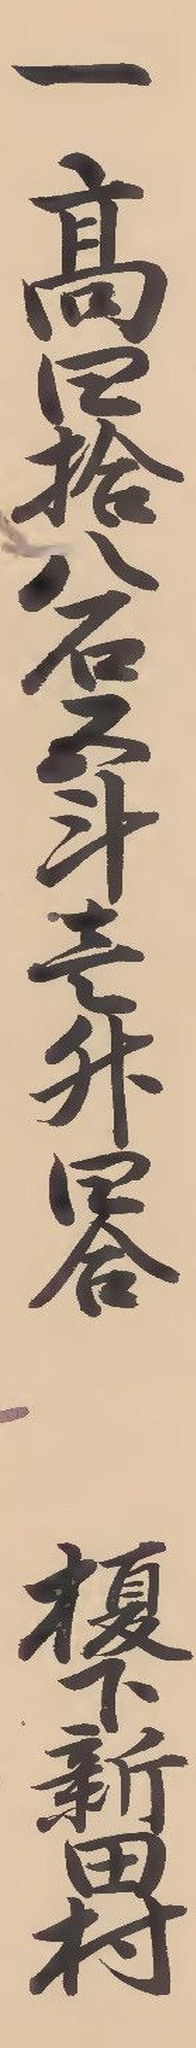一高四拾八石五斗壱升四合榎下新田村

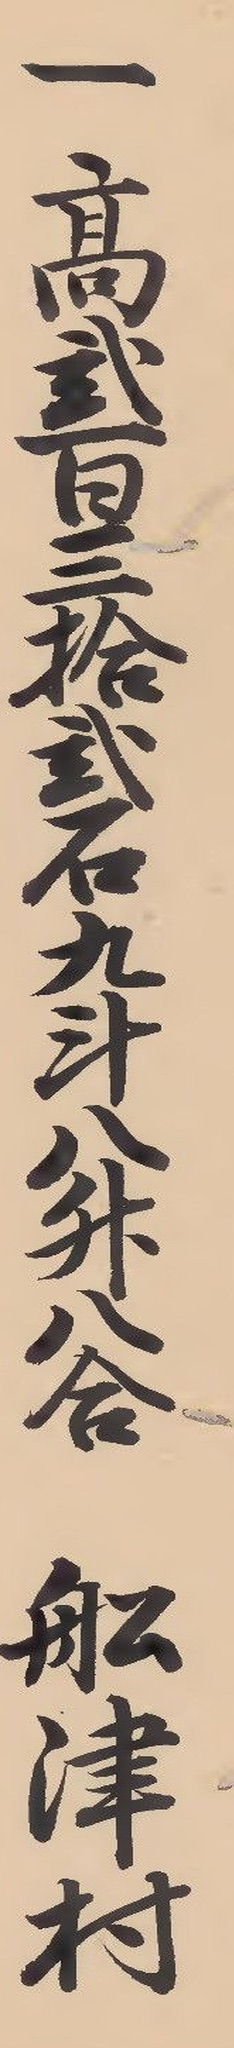一高弐百三拾弐石九斗八升八合舩津村
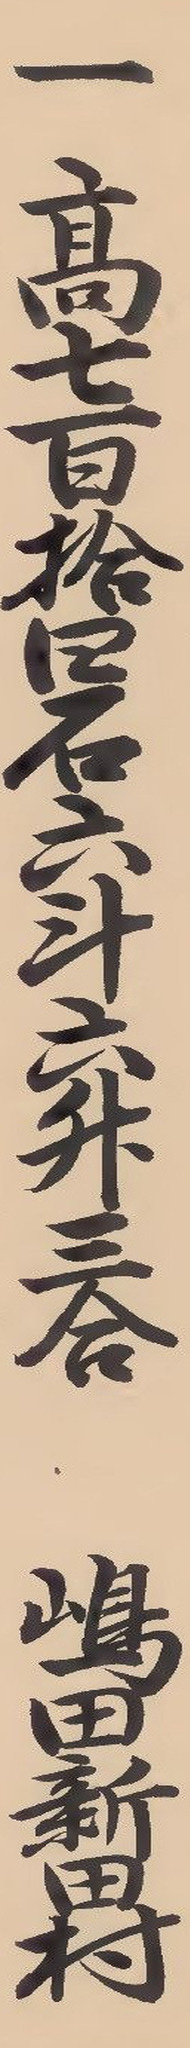一高七百拾四石六斗六升三合島田新田村
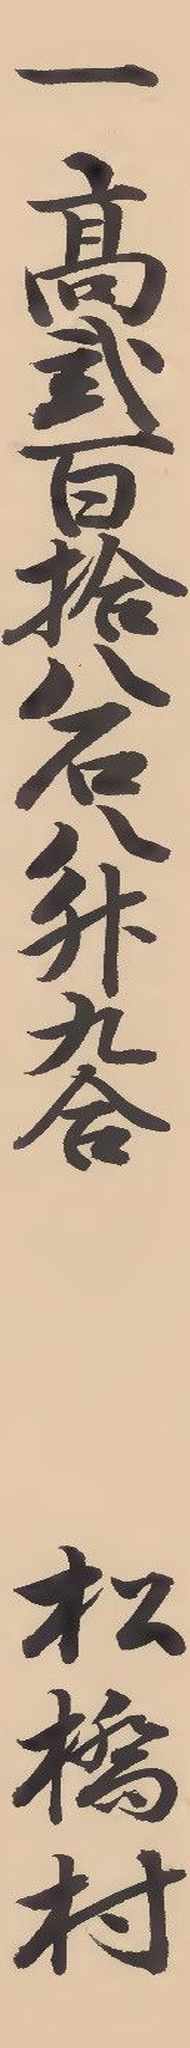一高弐百拾八石八升九合松橋村
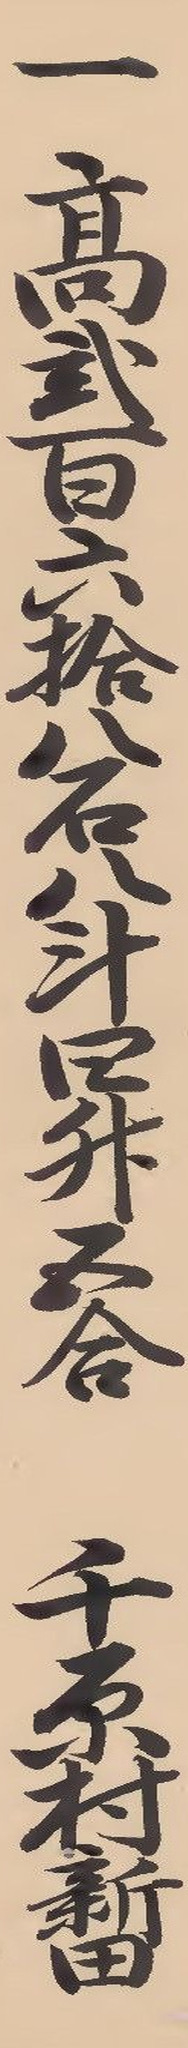一高弐百六拾八石八斗四升五合千原村新田
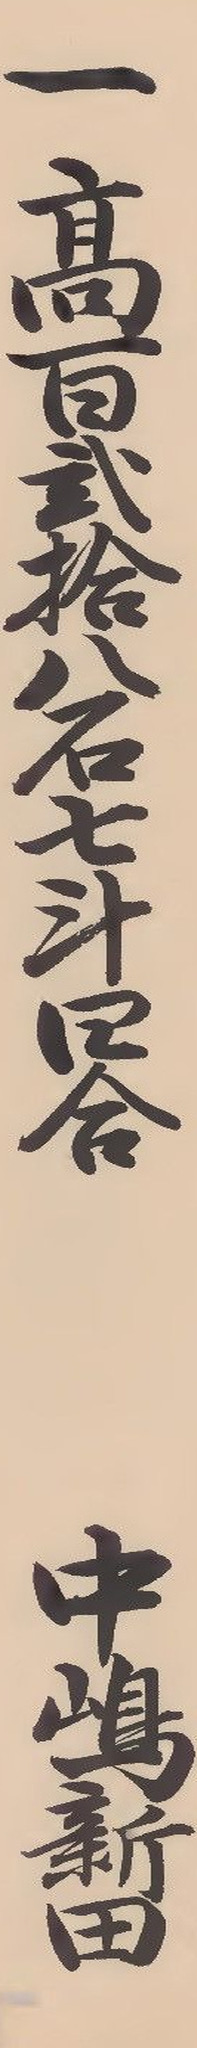一高百弐拾八石七斗四合中島新田
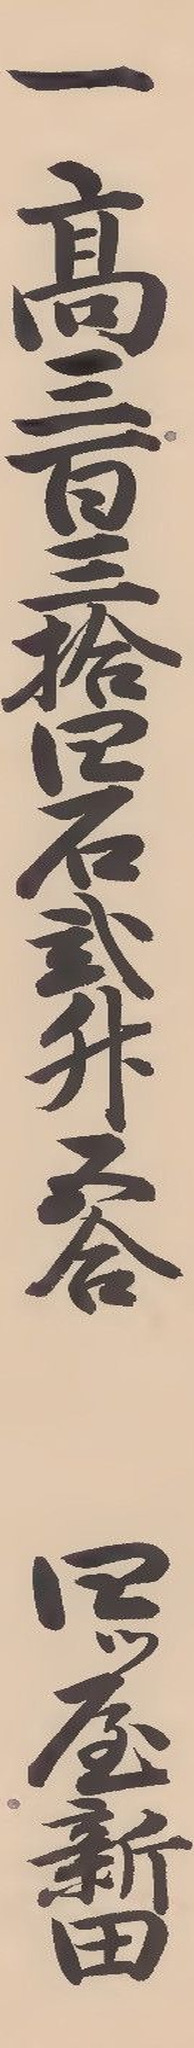一高三百三拾四石弐升五合四ツ屋新田
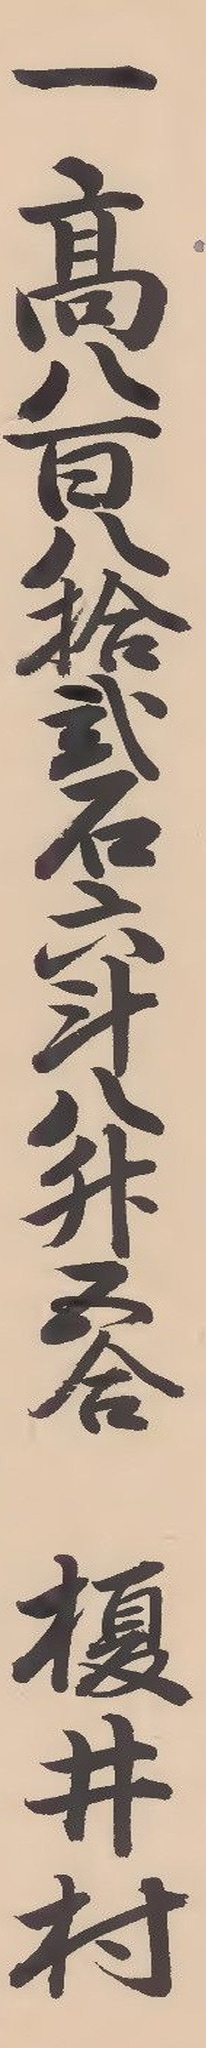一高八百八拾弐石六斗八升五合榎井村
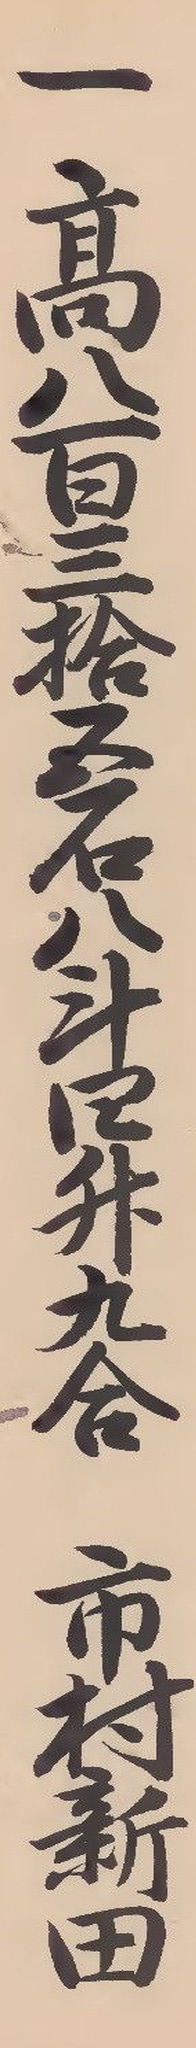一高八百三拾五石八斗四升九合市村新田

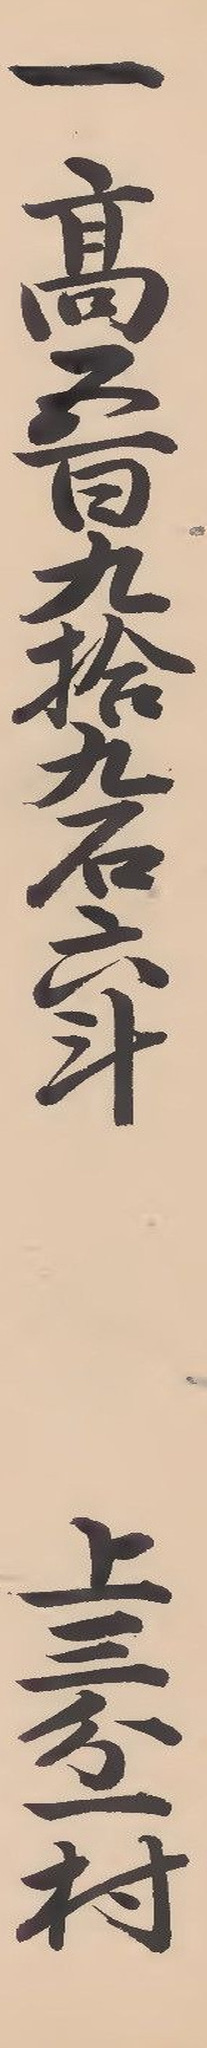一高五百九拾九石六斗上三分一村
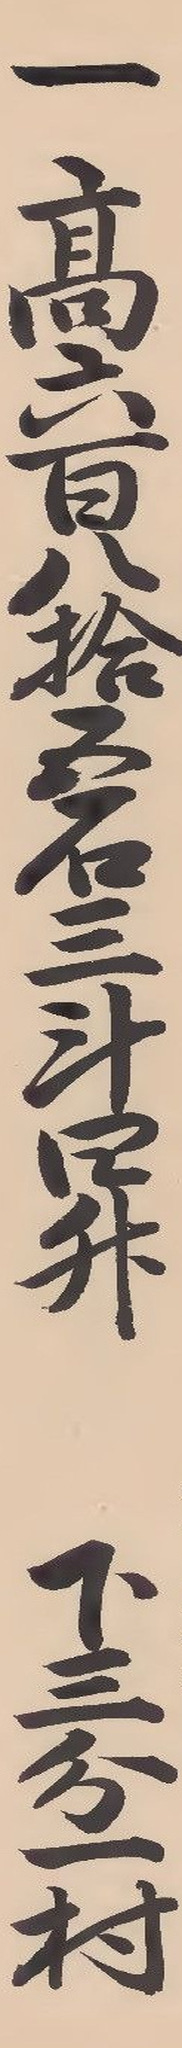一高六百八拾五石三斗四升下三分一村
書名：越後国郷帳　上
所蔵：国立公文書館 National Archives of Japan
